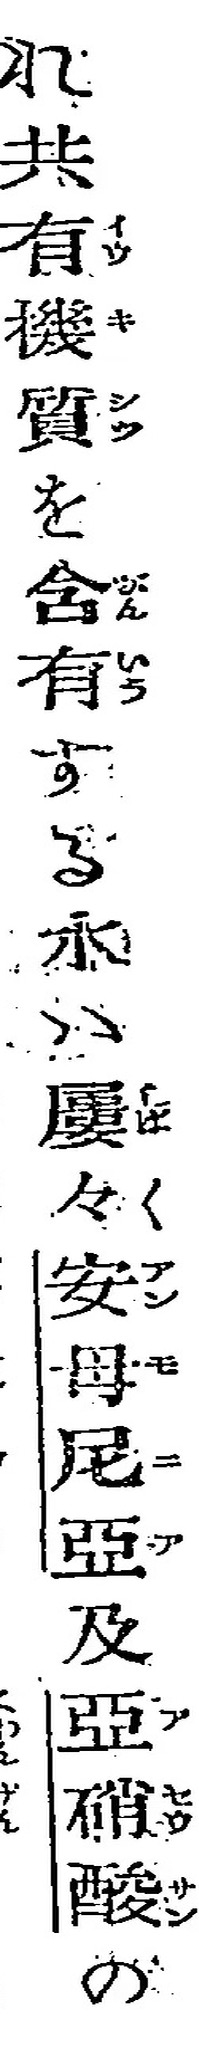れ共有機質を含有する水は屡々安母尼亞及亞硝酸の
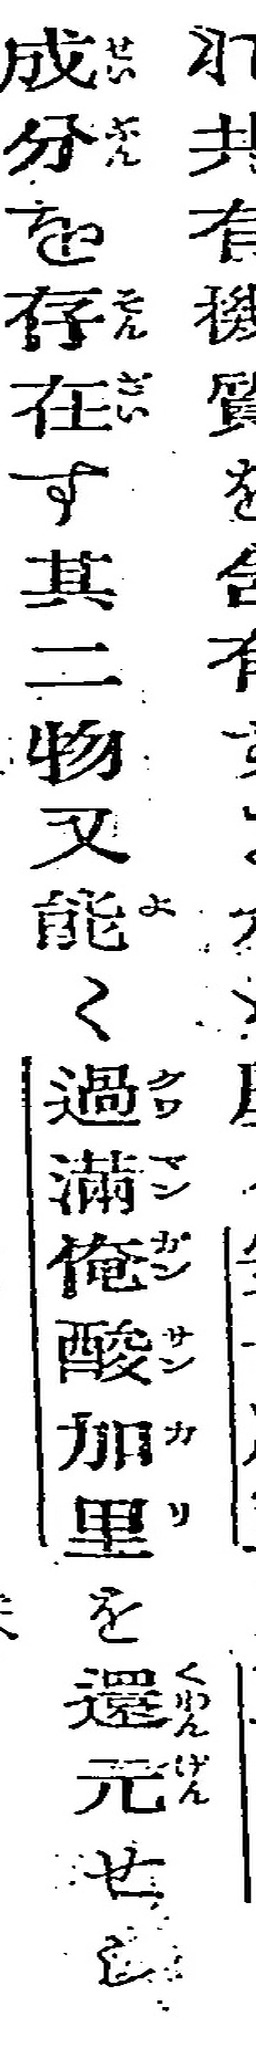成分を存在る其二物又能く過滿俺酸加里を還元せし
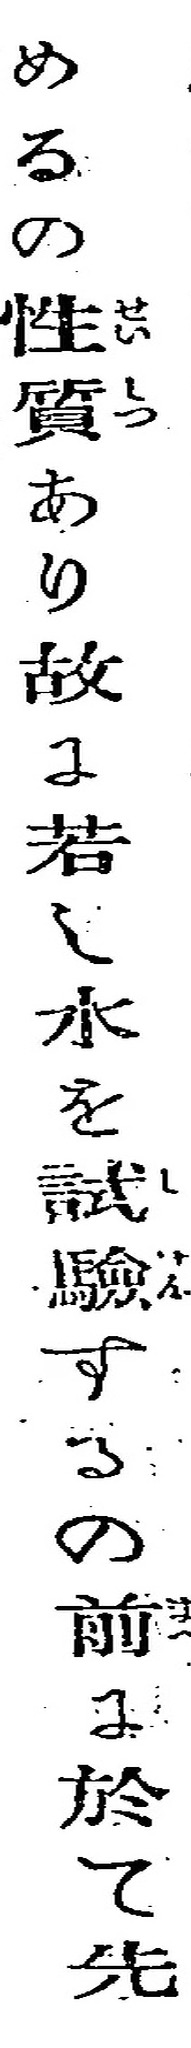めるの性質あり故に若し水を試験するの前に於て先
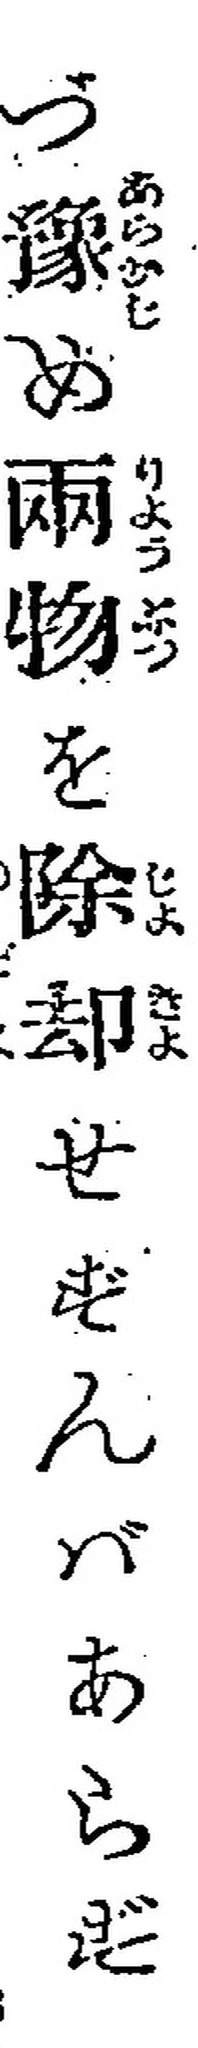づ豫め両物を除去せずんばあらず
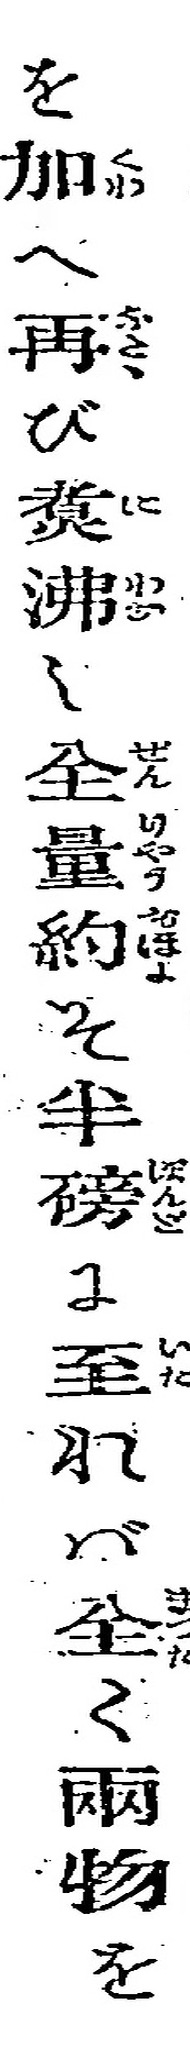を加へ再び煑沸し全量約そ半磅に至れば全く両物を
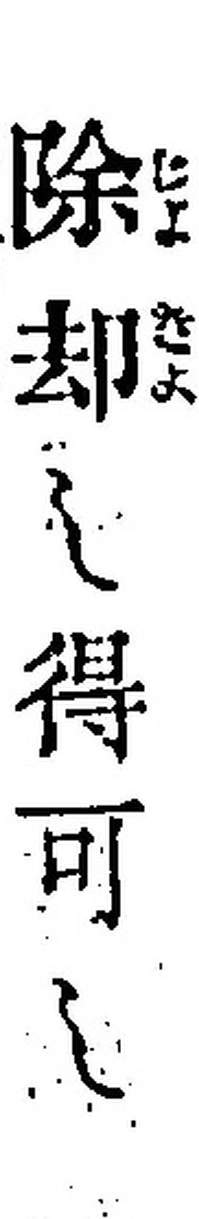除去し得可し
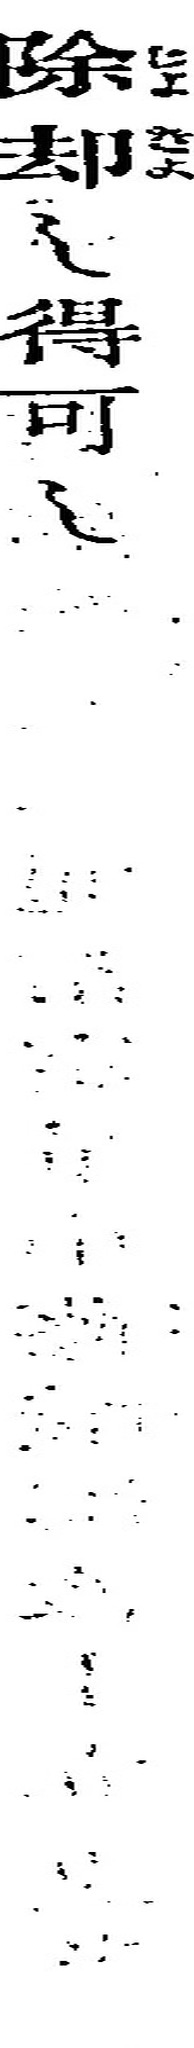除去し得可し
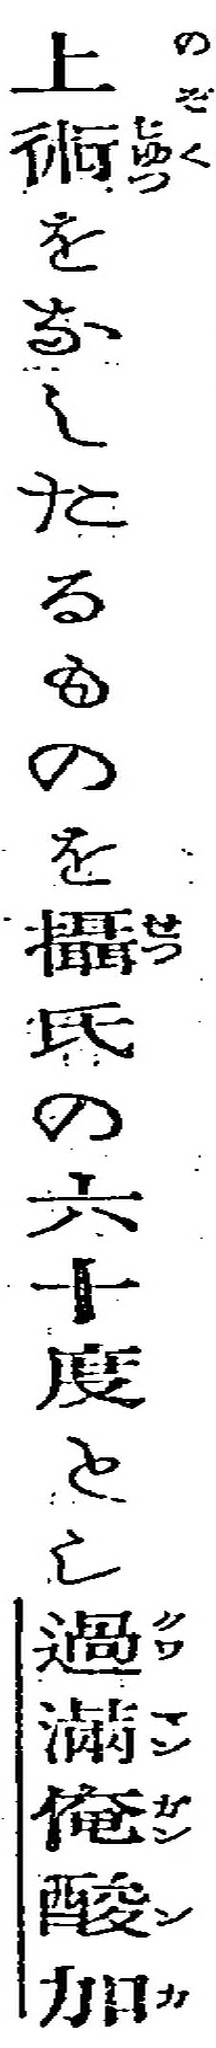上術をなしたるものを摂氏の六十度とし過滿俺酸加
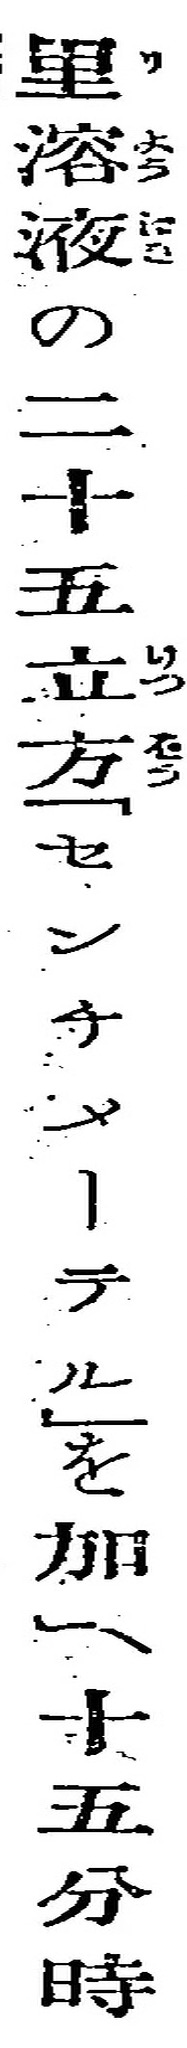里溶液の二十五立方[センチメーテル]を加へ十五分時
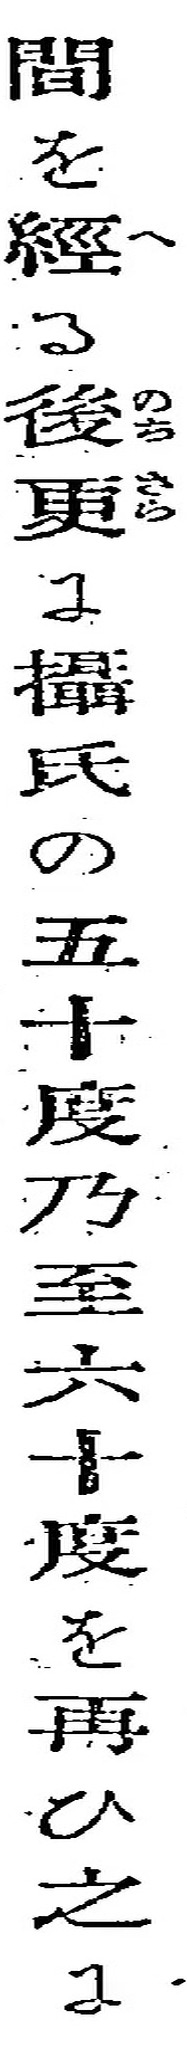間をえ経る後更に摂氏の五十度乃至六十度を再ひ之に
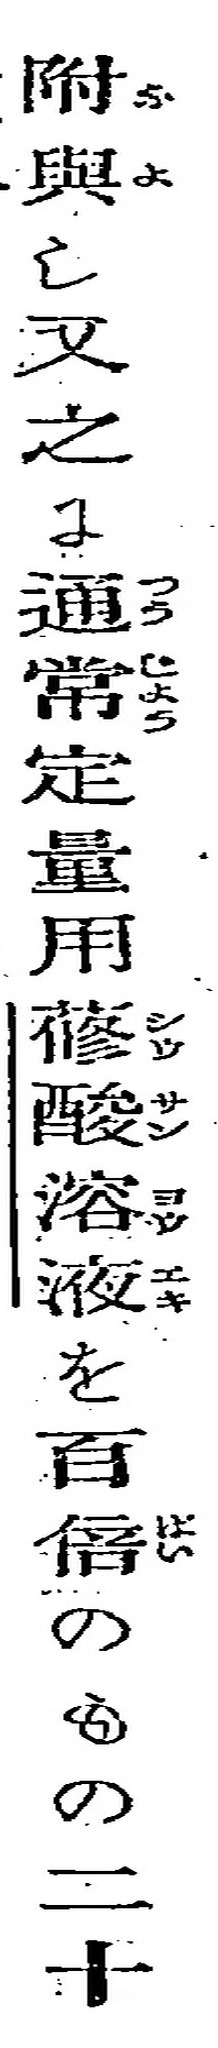附與し又之に通常定量用蓚酸溶液を百倍のもの二十
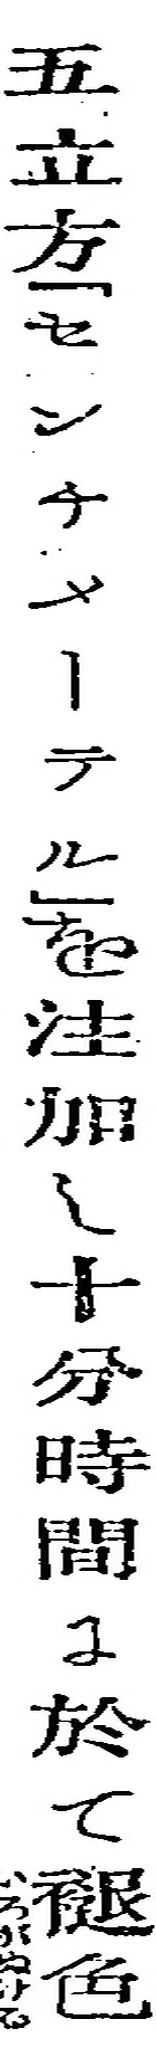五立方[センチメーテル]を注加し十分時間に於て褪色
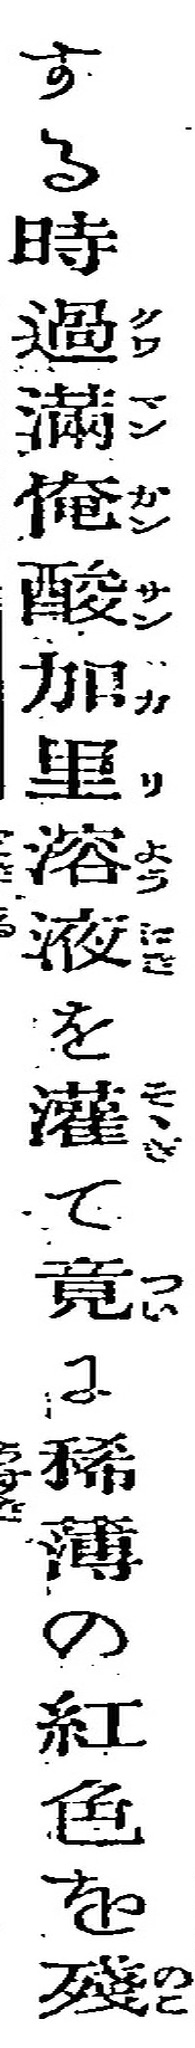する時過滿俺酸加里溶液を灌て竟に稀薄の紅色を残
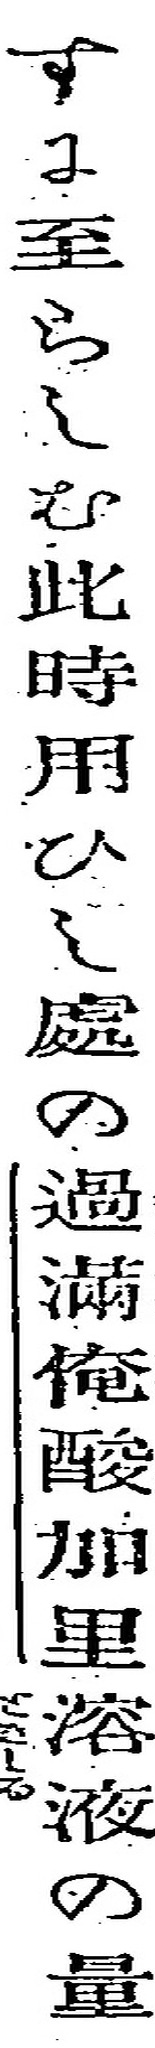すに至らしむ此時用ひし處の過滿俺酸加里溶液の量
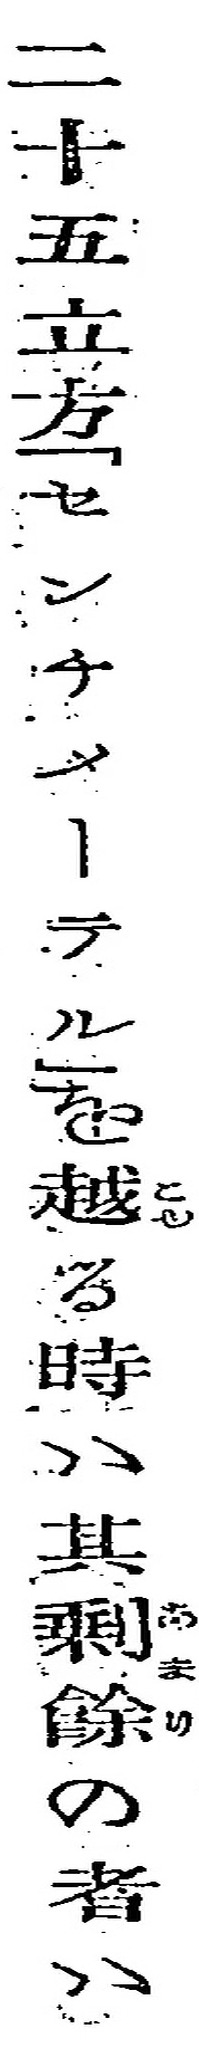二十五立方[センチメーテル]を越る時は其剰餘の者は
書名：飲水の心得 : 伝染病の予防
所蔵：国立国会図書館 National Diet Library, JAPAN
